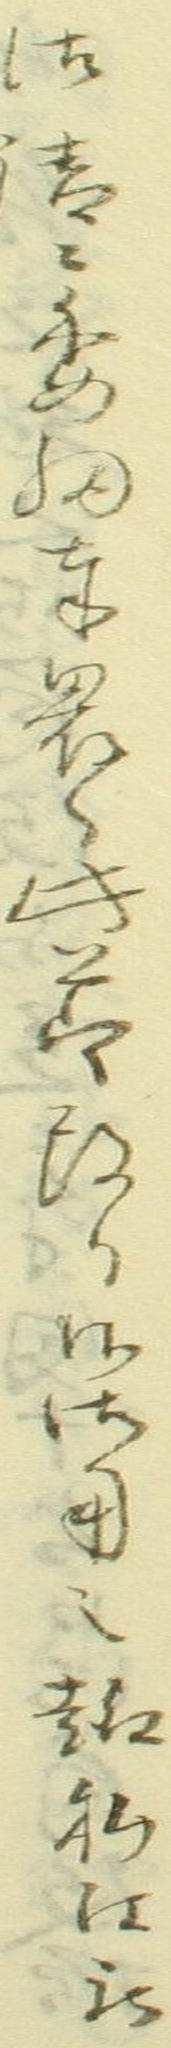御請に委細奉畏候此節限り候御用趣私江被
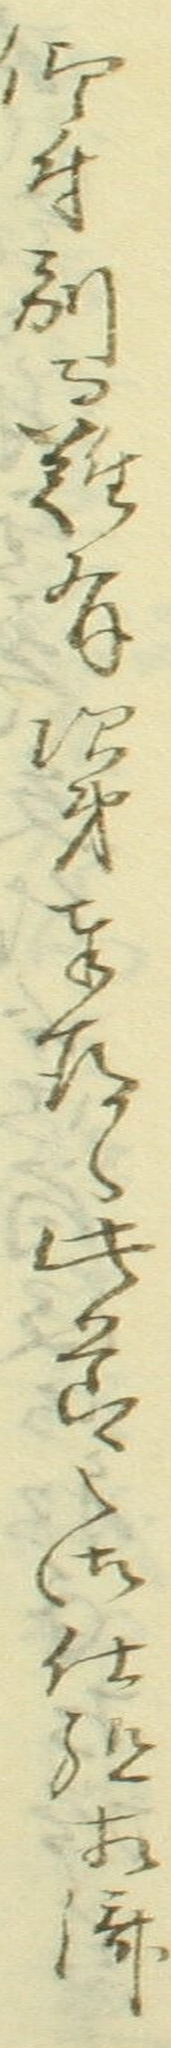仰付別而難有次第奉存候此節之御仕組相済
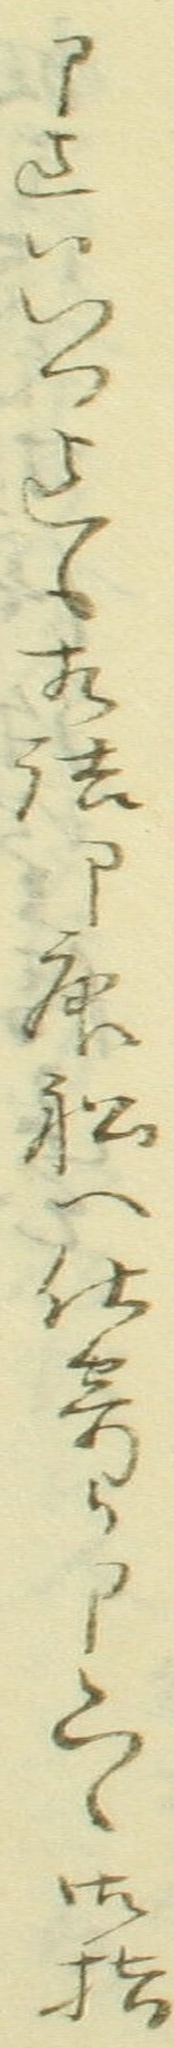申迠はいつ迄も相詰申唐船へ仕寄り申候はは御指
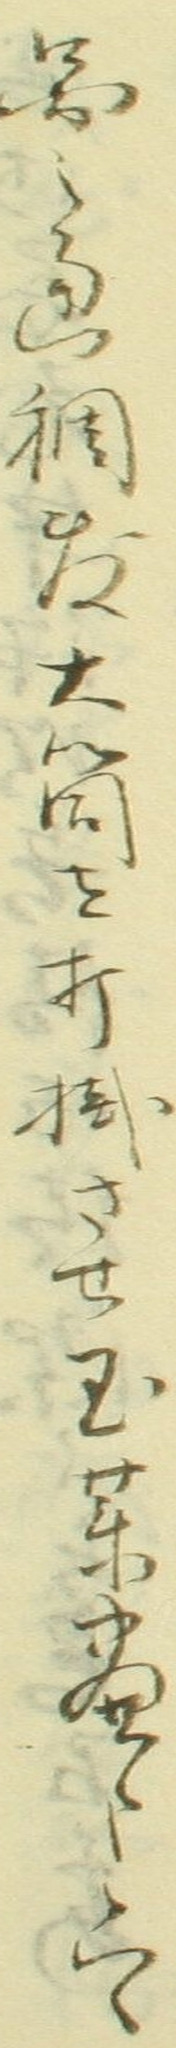図之通稠敷大筒を打掛させ玉薬盡申候はは
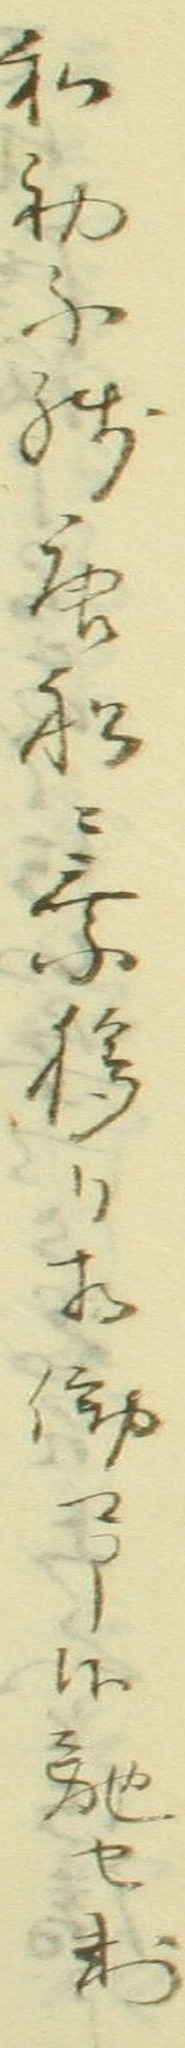私初不残唐船に乗移相働可申候馳せ？

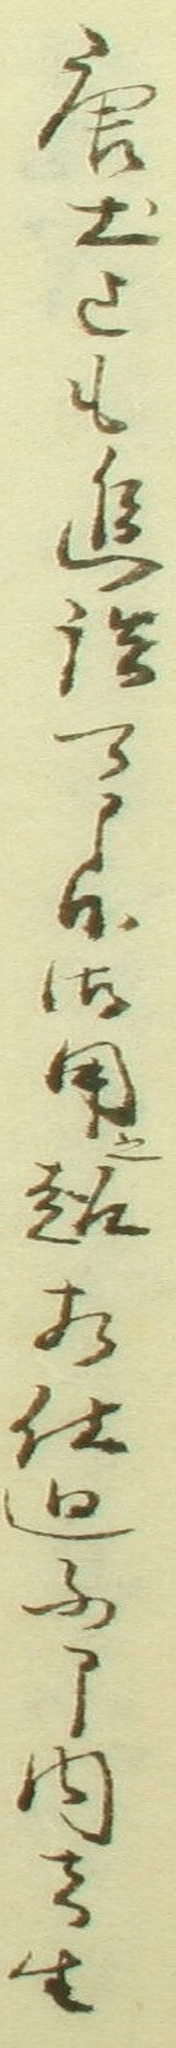唐土迄も追詰可申候御用之趣相仕迴不申内去生
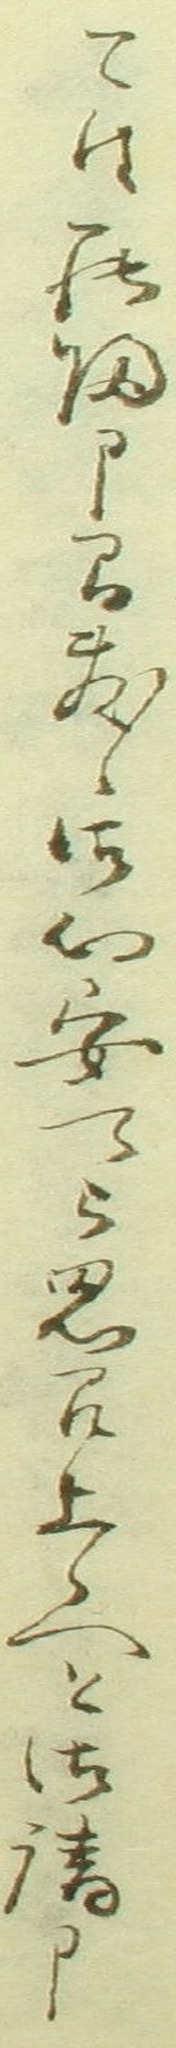ては罷帰申間敷候御心安可被思召上候へと御請申
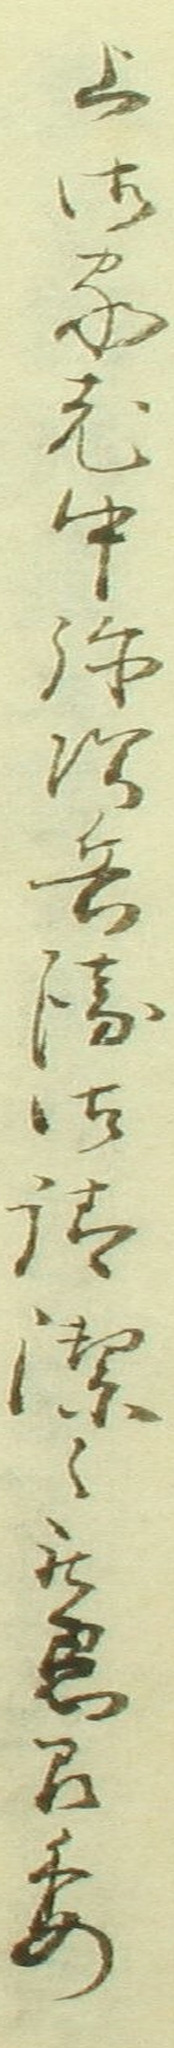上御家老中弥次兵衛御詰潔く被？間委
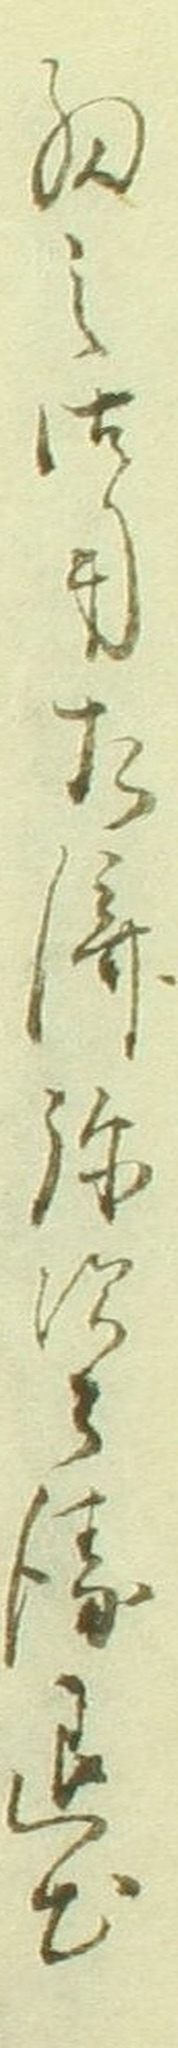細之御用相済弥次衛門退出
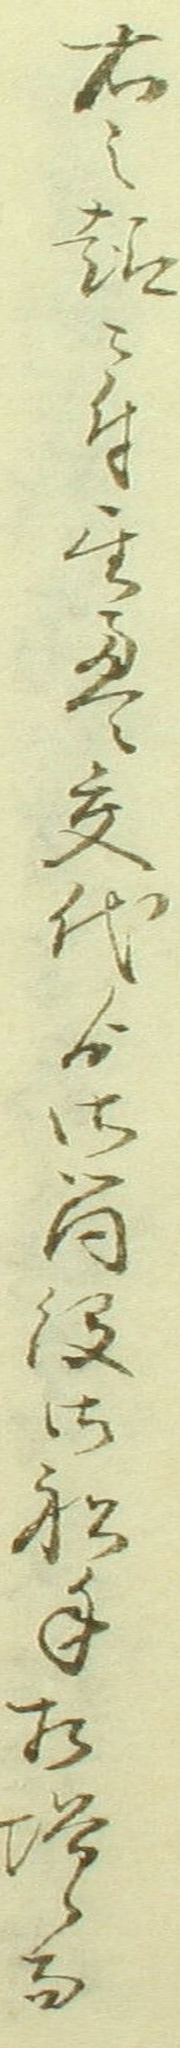右之趣に付置畳交代ゟ御筒役御船手相増候而
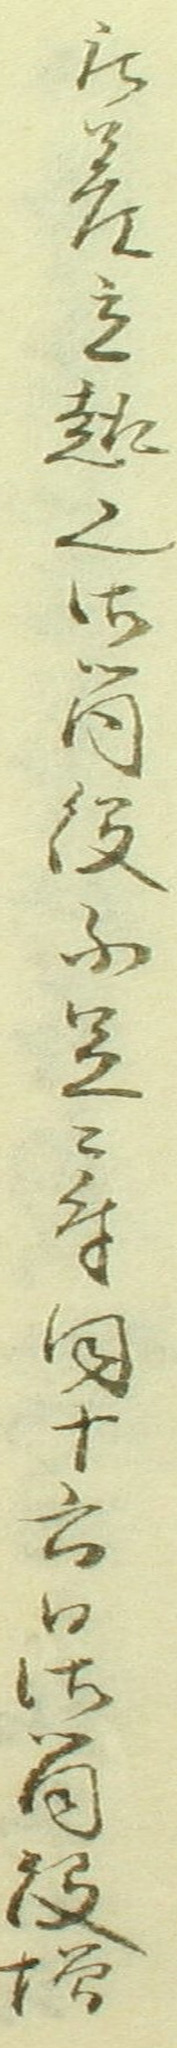被差立趣也御筒役不足に付十六日御筒役増
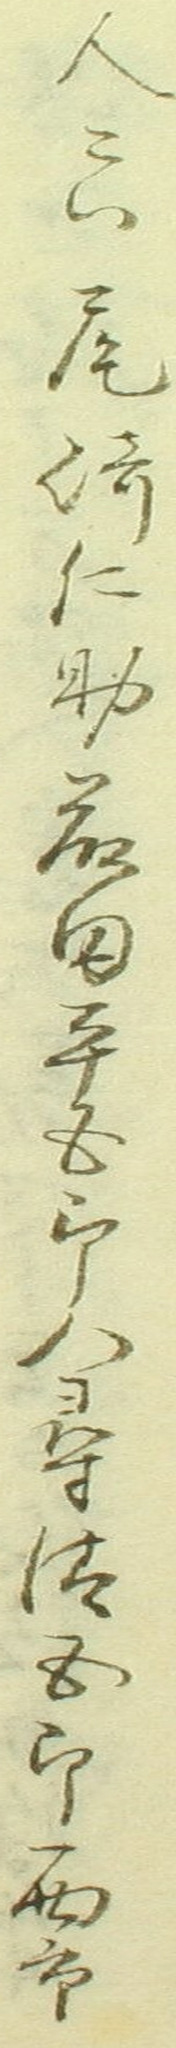人には尾崎仁助藤田平五郎八尋清五郎西市
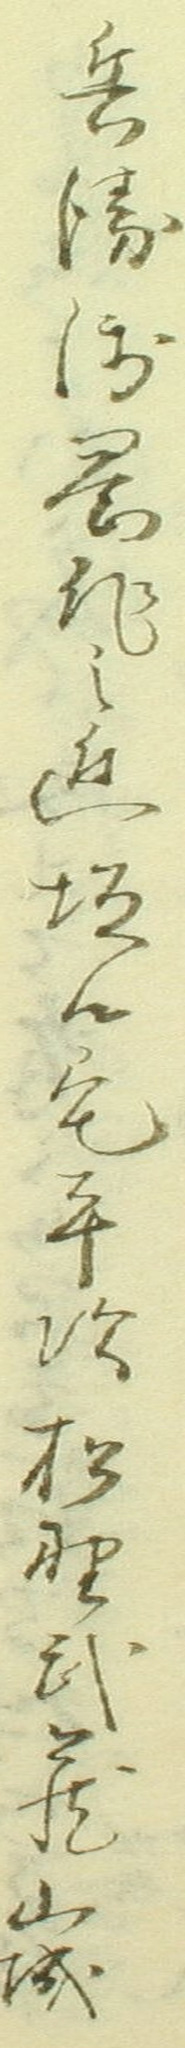兵衛沙岡作之進坂？宅平次松野武蔵山城
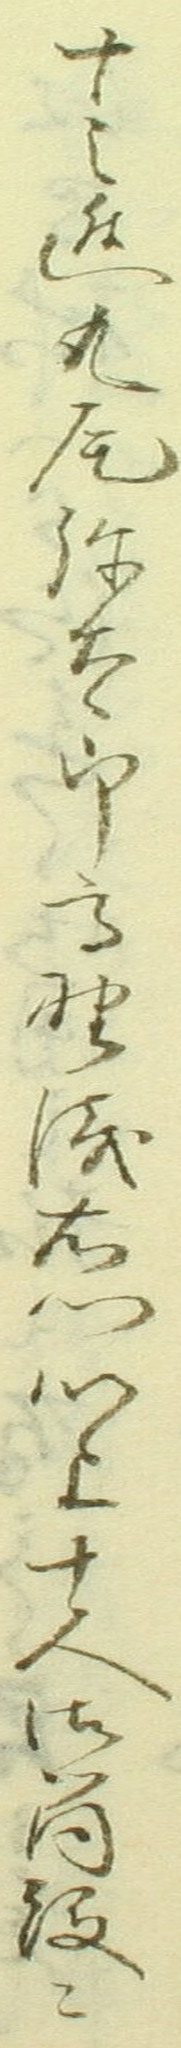十之進丸尾弥？郎高野儀右衛門以上十人御筒役に
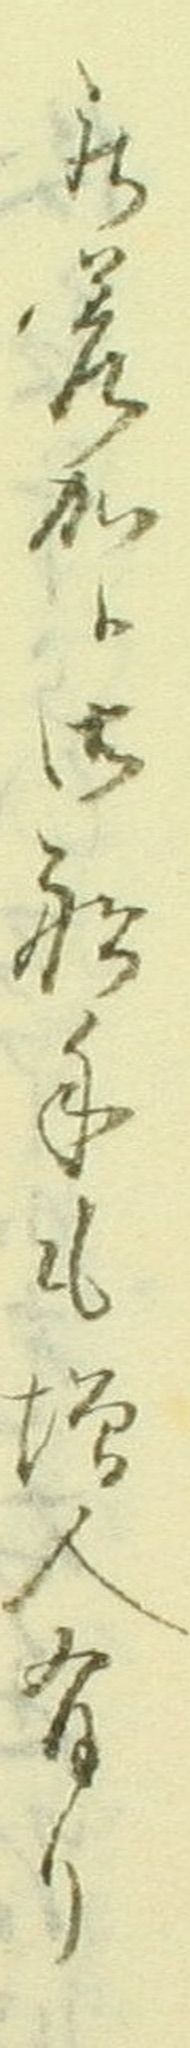被差加候御船手も増人有り
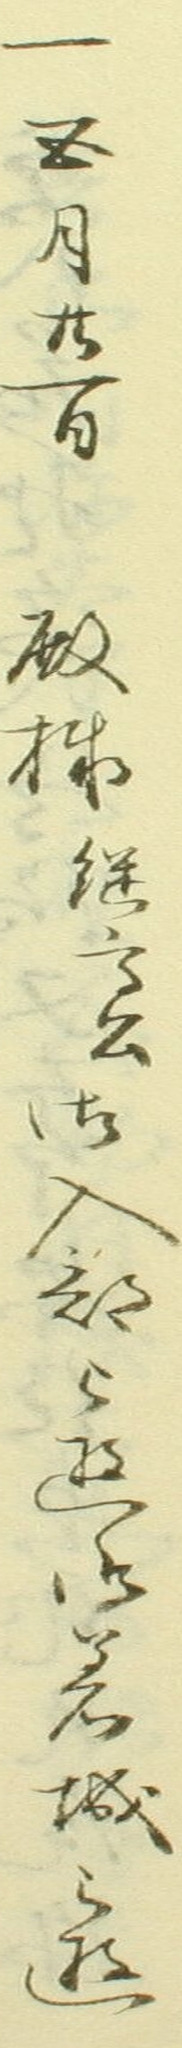一五月廿一日殿様継高？御入部被遊候御着城被遊
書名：唐船漂流記 四
